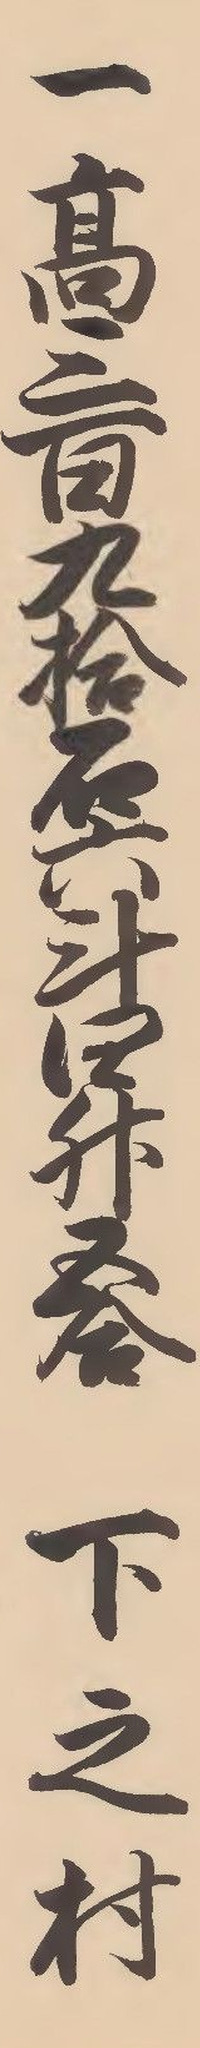一高三百九拾石六斗四升五合下之村
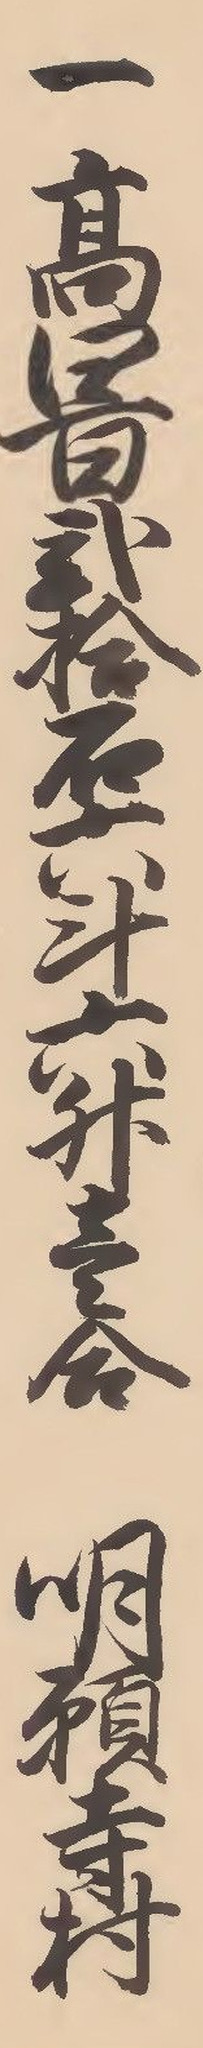一高四百弐拾石六斗六升壱合明願寺村

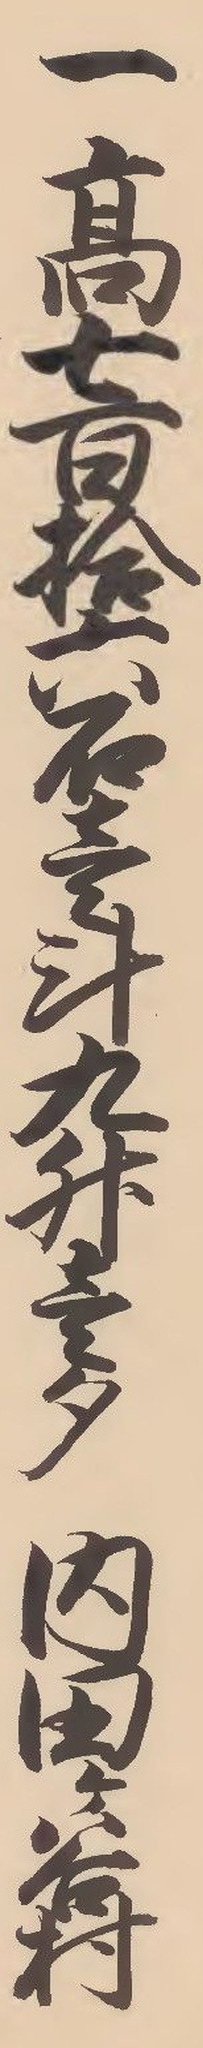一高七百拾六石壱斗九升壱勺内田ヶ谷村
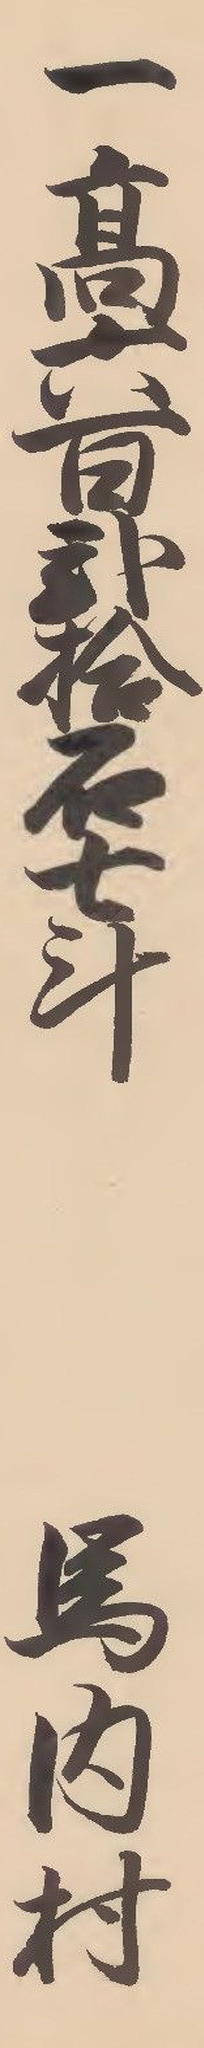一高六百弐拾石七斗馬内村
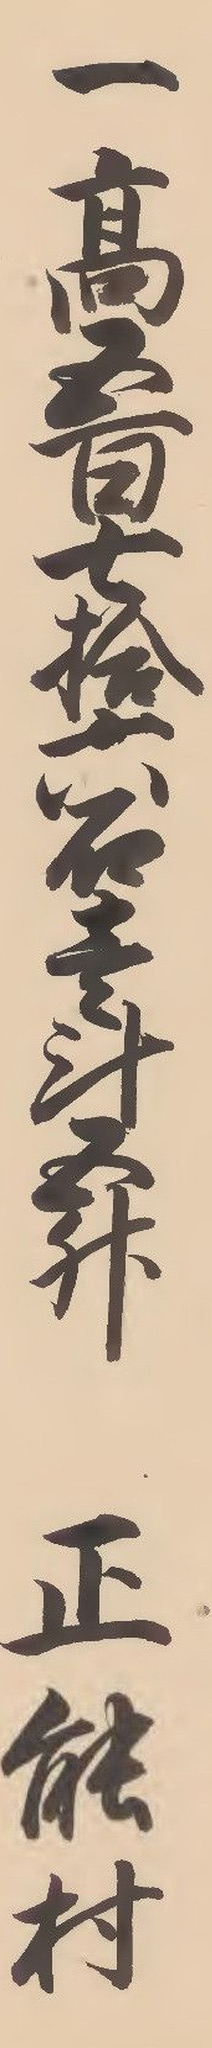一高五百七拾六石壱斗五升正能村
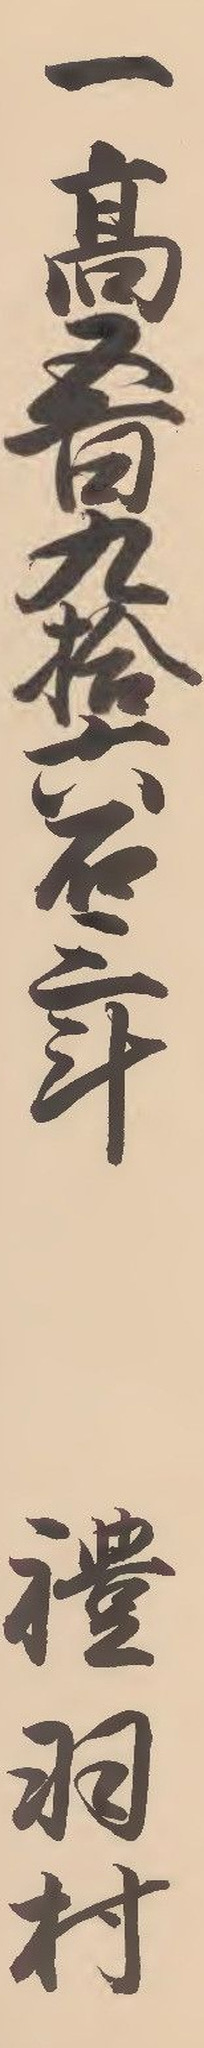一高五百九拾六石三斗礼羽村
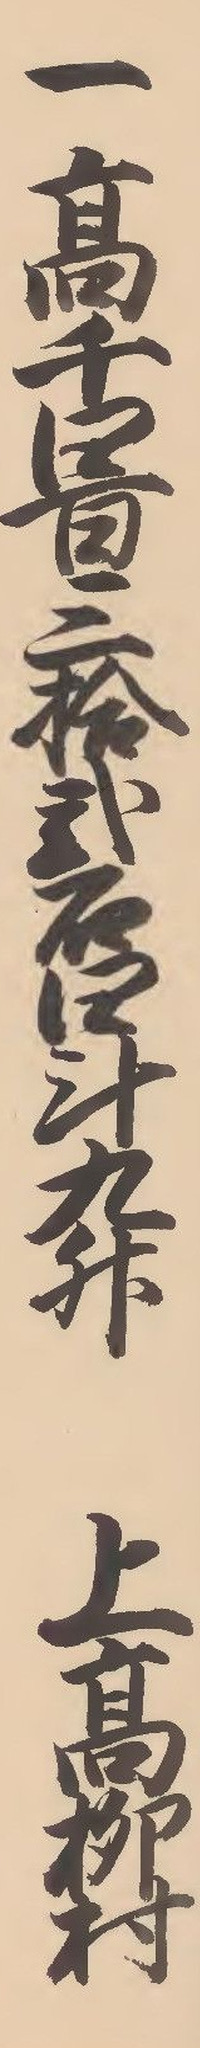一高千四百三拾弐石四斗九升上高柳村
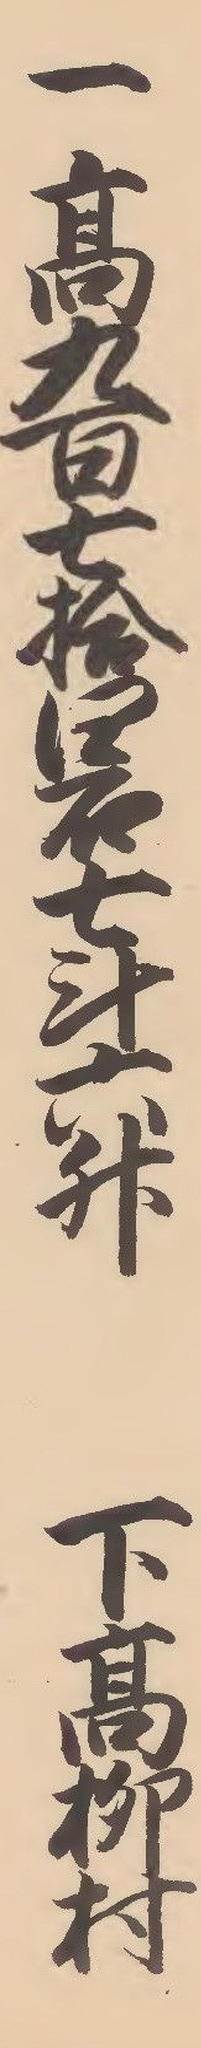一高九百七拾四石七斗六升下高柳村
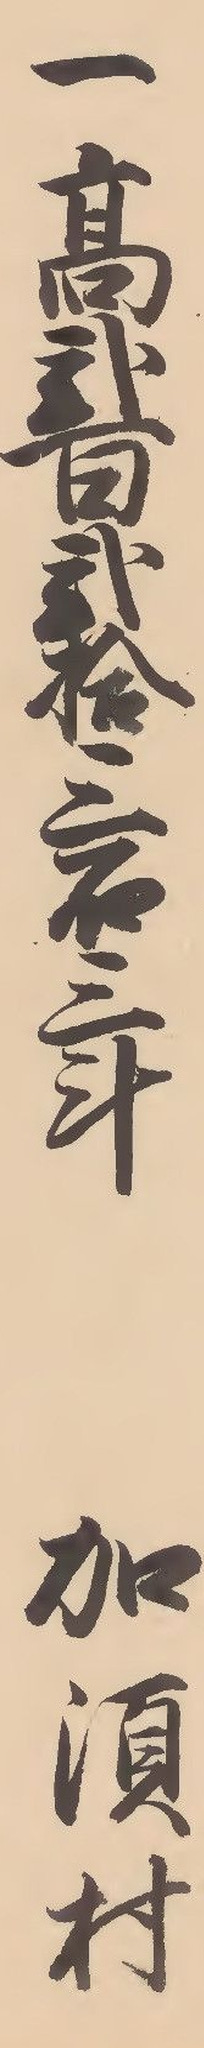一高弐百弐拾三石三斗加須村
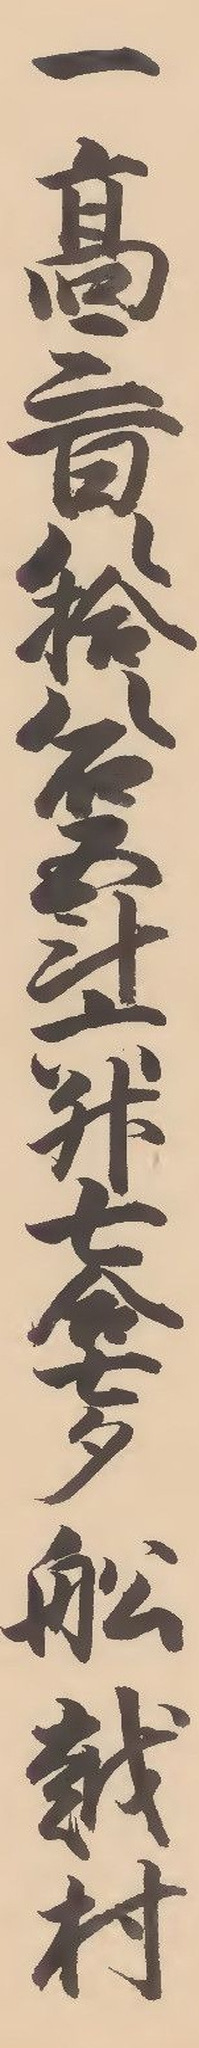一高三百八拾八石五斗六升七合七勺船越村

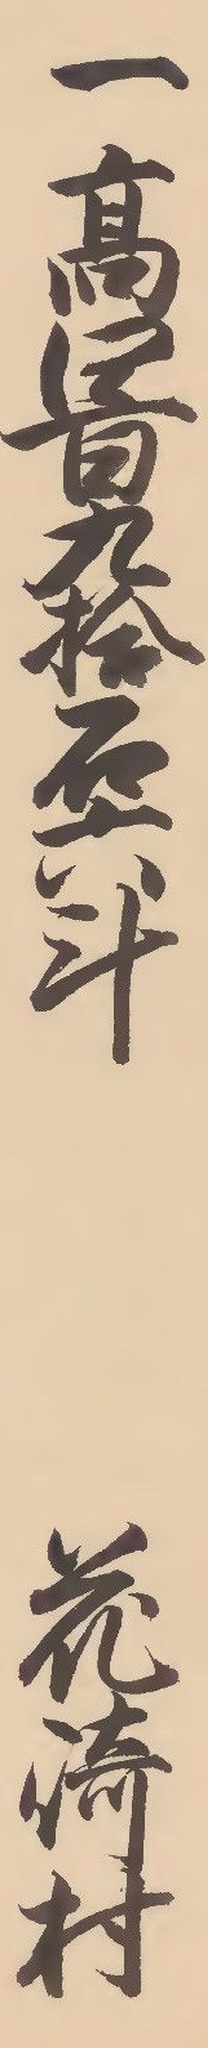一高四百九拾石六斗花崎村
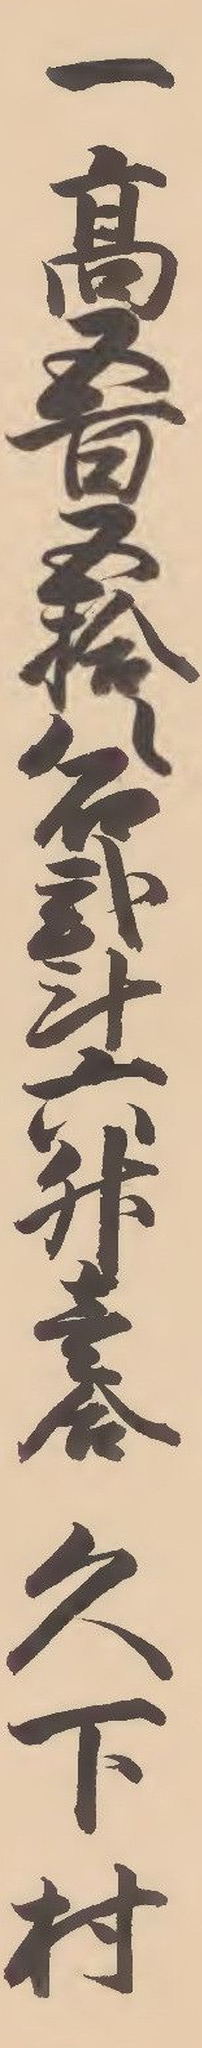一高五百五拾八石弐斗六升壱合久下村
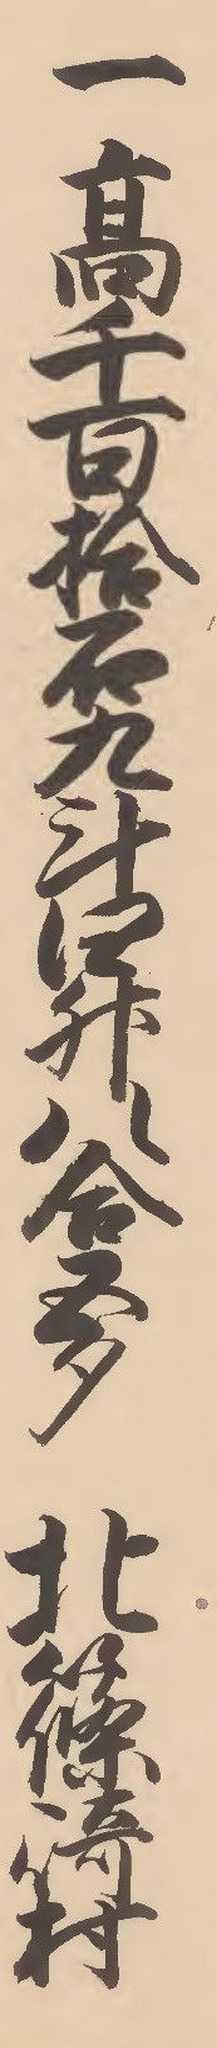一高千百拾九斗四升八合五勺北篠崎村
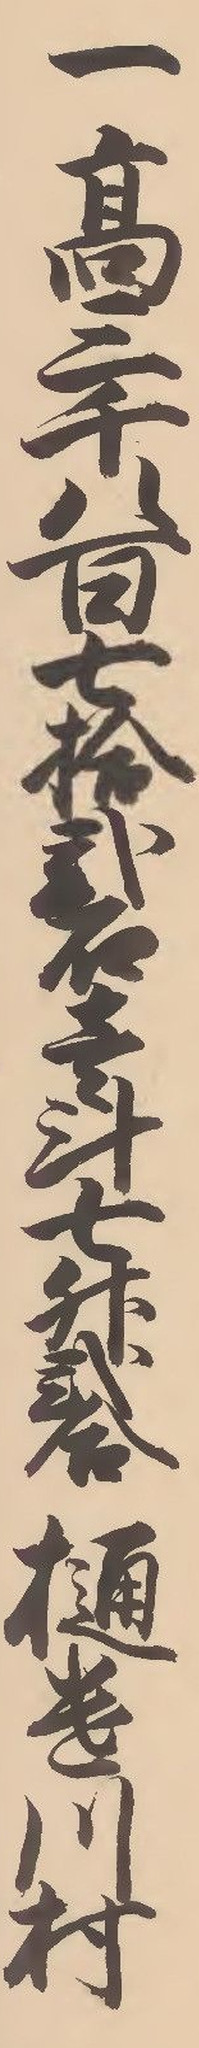一高三千八百七拾弐石壱斗七升弐合樋遣川村
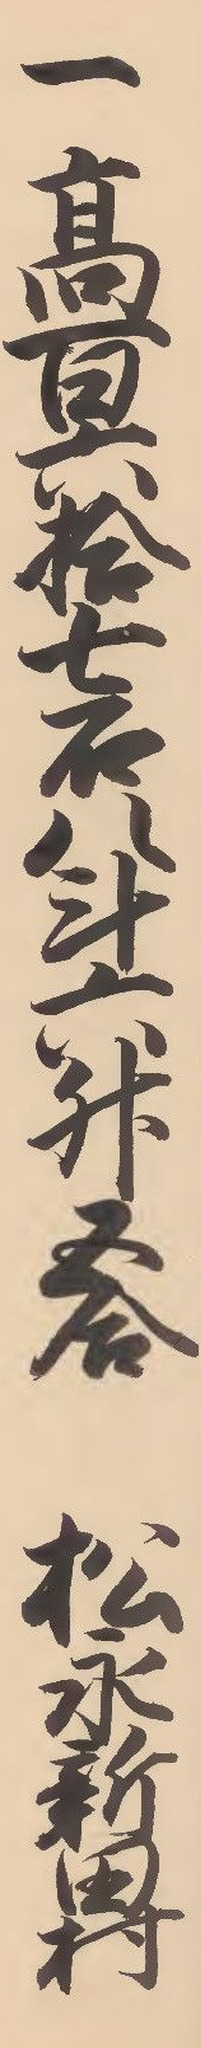一高百六拾七石八斗六升五合松永新田村
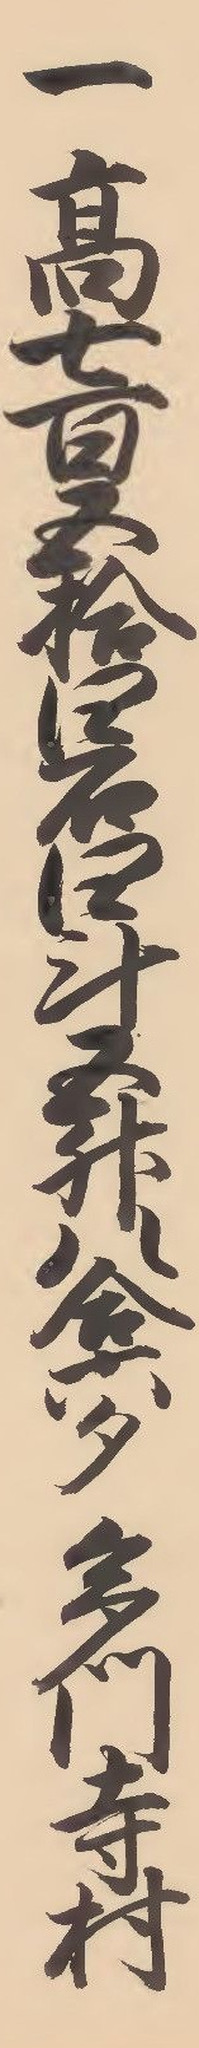一高七百五拾四石四斗五升八合六勺多門寺村
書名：武蔵国郷帳　下
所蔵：国立公文書館 National Archives of Japan
